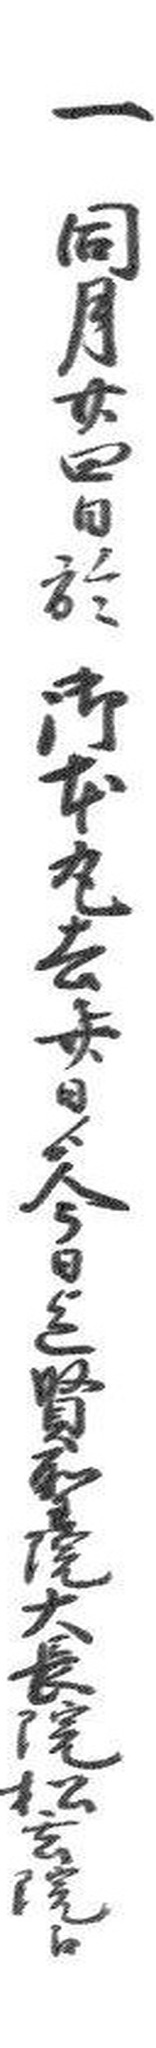一同月廿四日於御本丸去ル廿日ゟ今日迄賢聖院大長院松玄院江
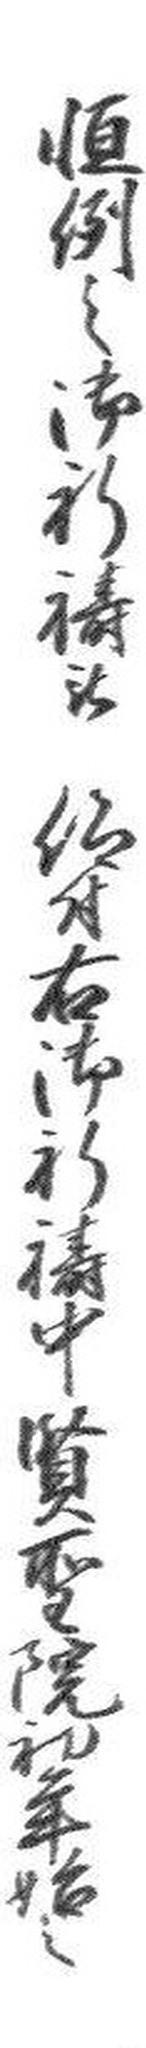恒例之御祈祷被仰付右御祈祷中賢聖院初年始之
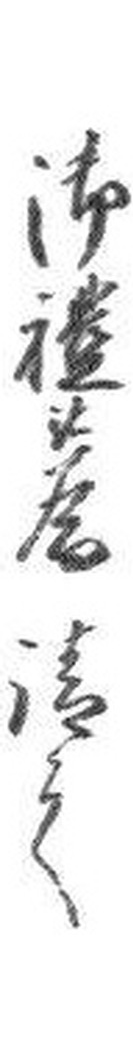御礼被為請之
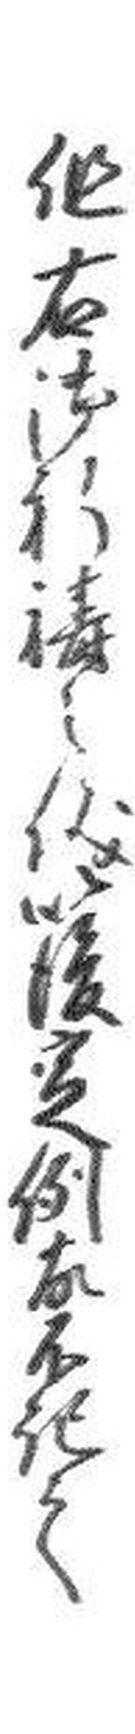但右御祈祷之儀以後定例故不記之
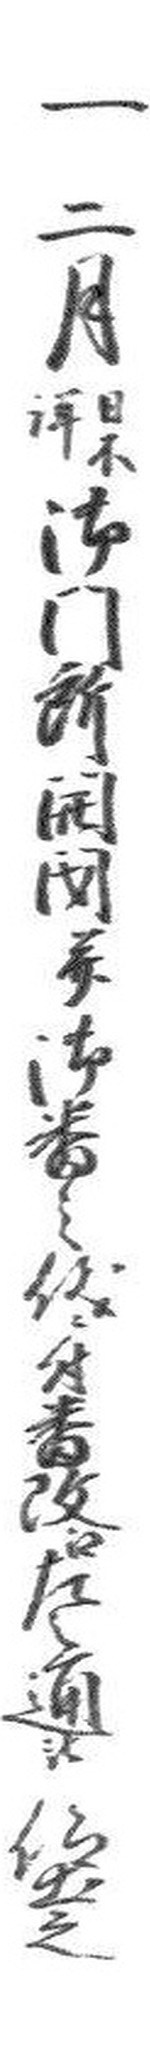一二月日不詳御門所開閉并御番之儀ニ付番改江左之通被仰出之
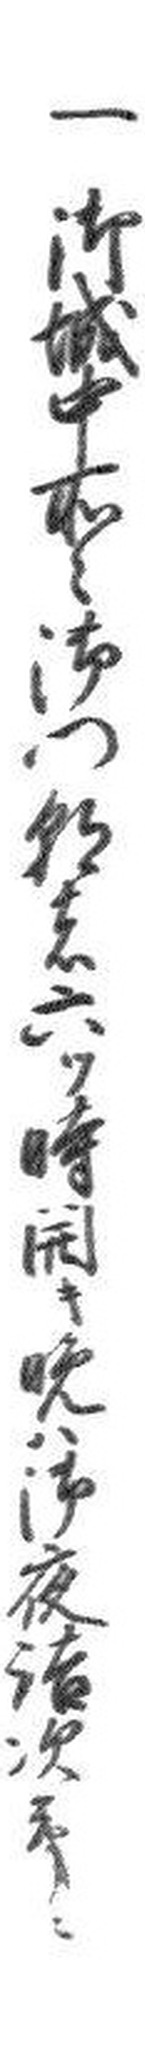一御城中所々御門朝者六ツ時開キ晩ハ御夜詰次第ニ
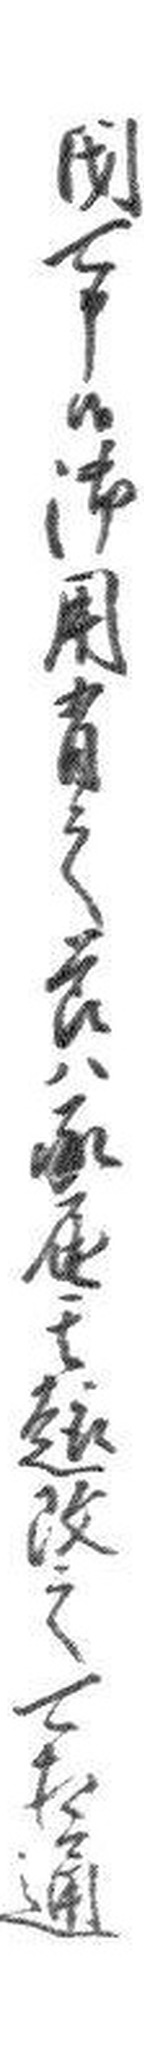閉可申候御用有之節ハ承届其趣改之可相通
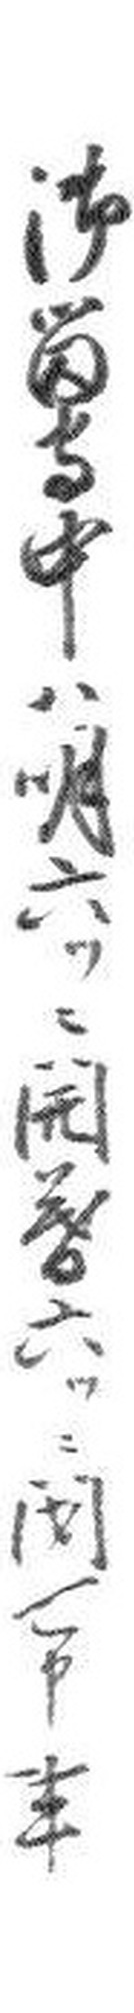御留守中ハ明六ツニ開暮六ツニ閉可申事
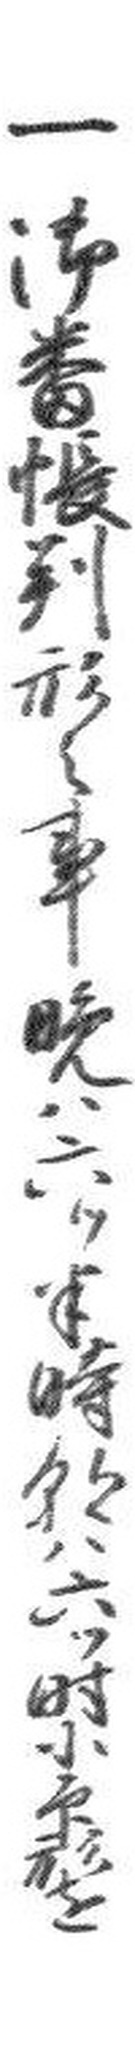一御番帳判形之事晩ハ六ツ半時朝ハ六ツ時小印形を
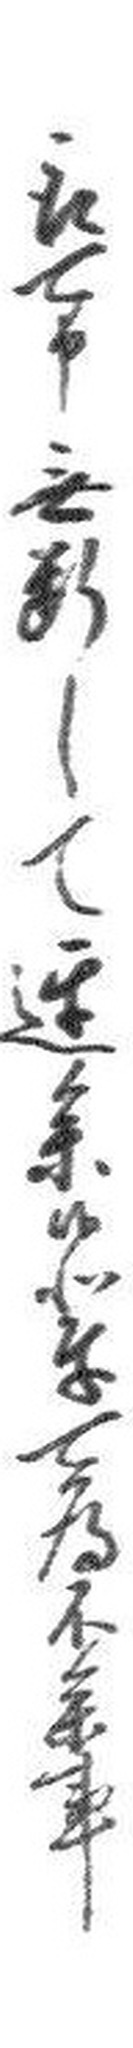取可申無断して遅参候輩可為不参事

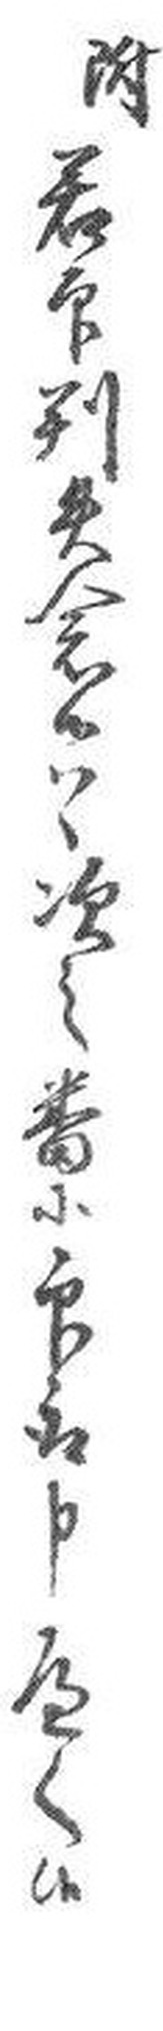附若印判失念候ハ丶次之番に印取申へく候
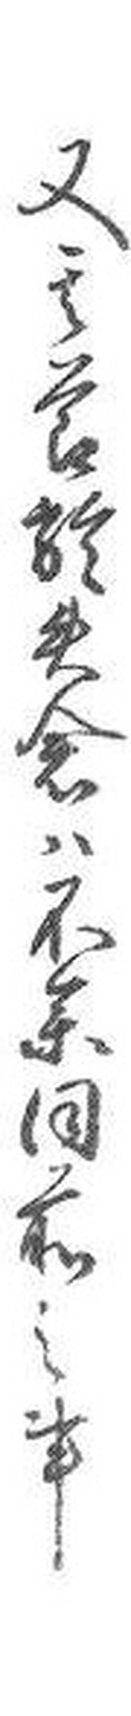又其節於失念ハ不参同前之事
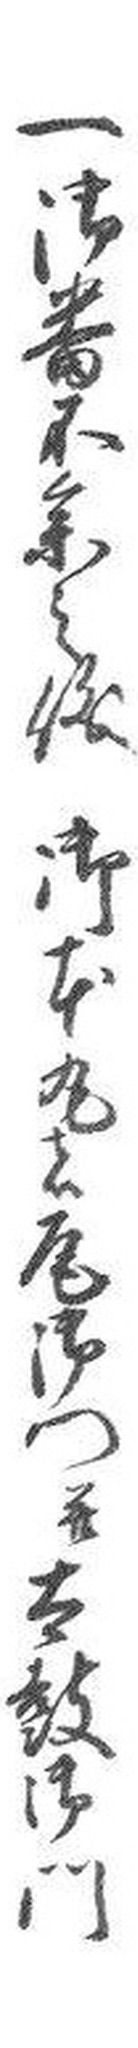一御番不参之儀御本丸者瓦御門并太鼓御門
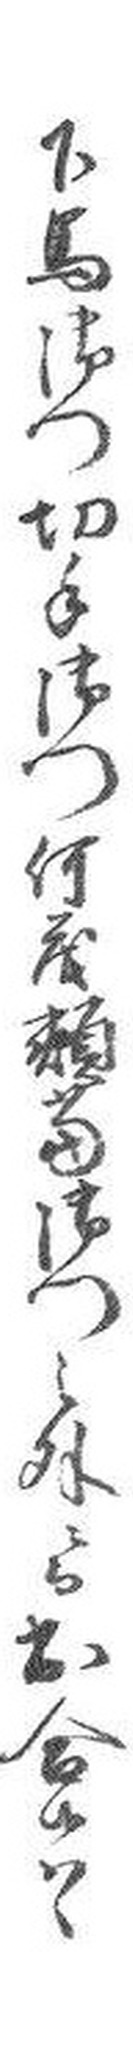下馬御門切手御門何も頬當御門之外ニ而出合候ハ丶
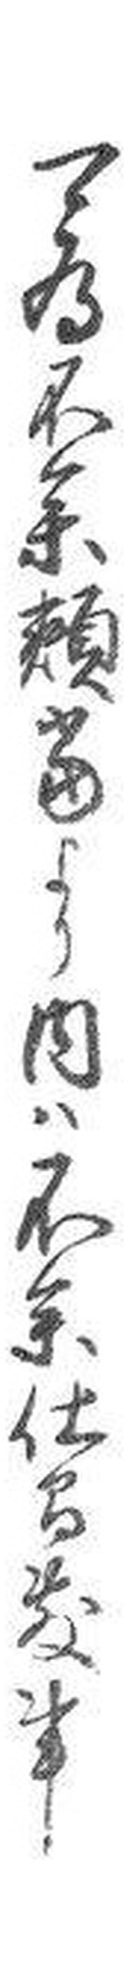可為不参頬當より内ハ不参仕間敷事
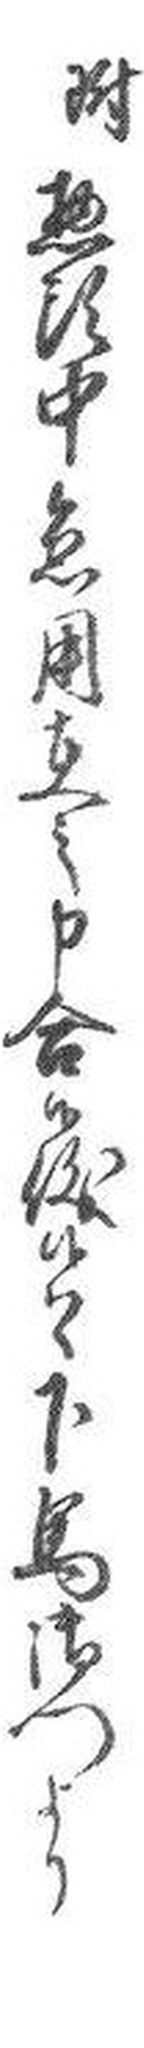附惣頭中急用在之申合候儀候ハ丶下馬御門より
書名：家譜 六 光通公 従万治三年到寛文三年
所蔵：福井県文書館 Fukui Prefectural Archives
